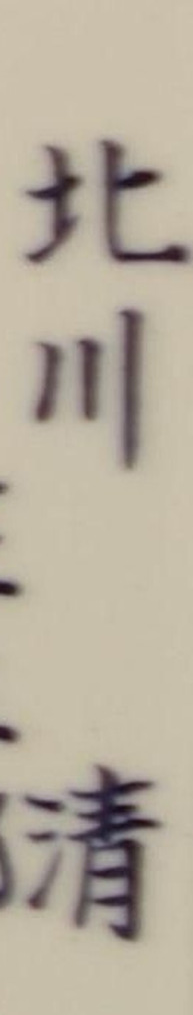北川清
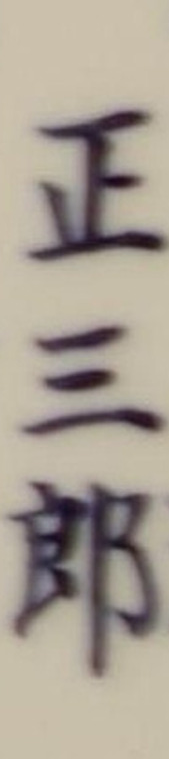正三郎
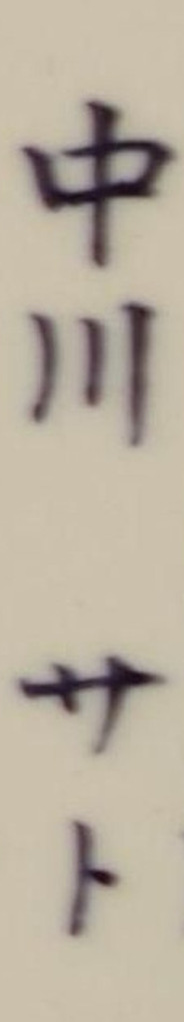中川サト
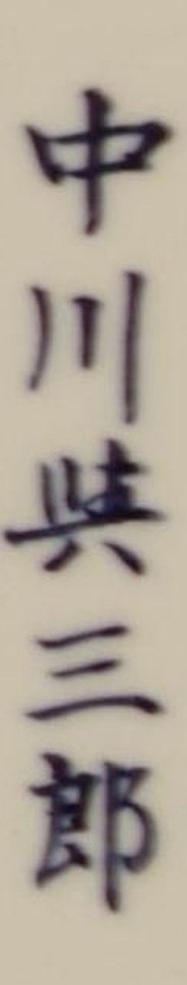中川与三郎
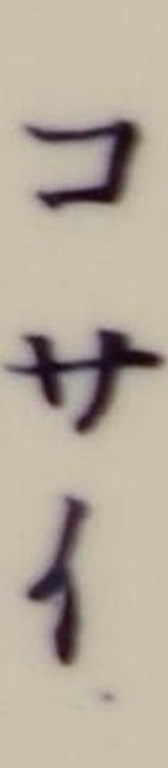コサイ
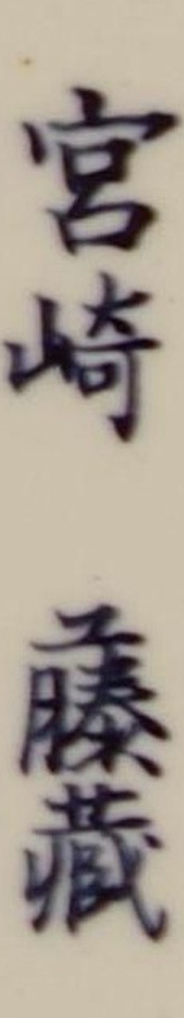宮崎藤蔵
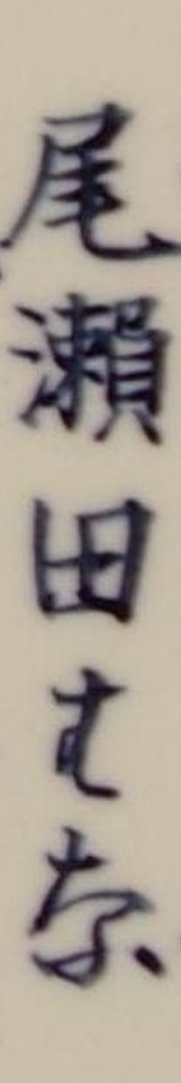尾瀬田はな
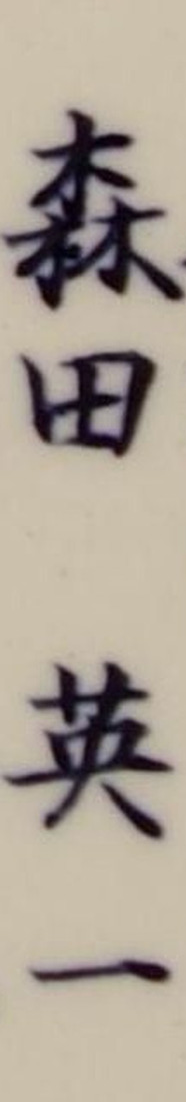森田英一
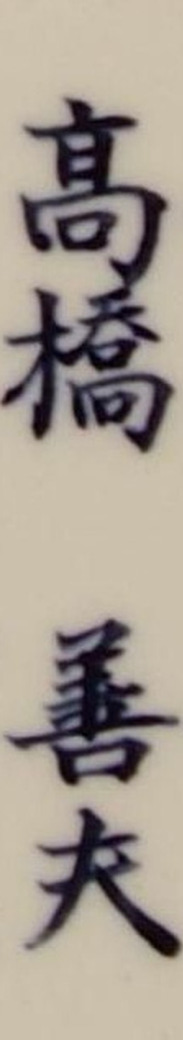高橋善夫
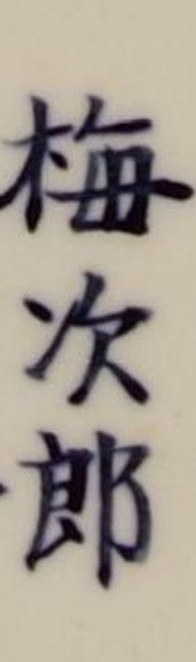梅次郎
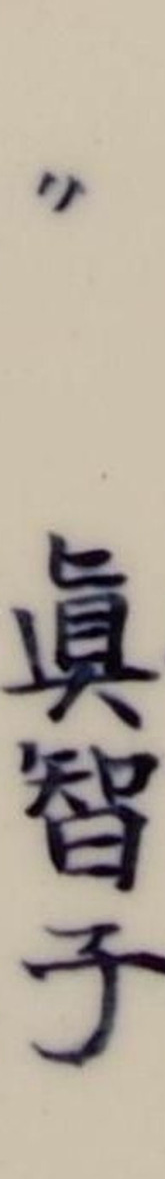真智子
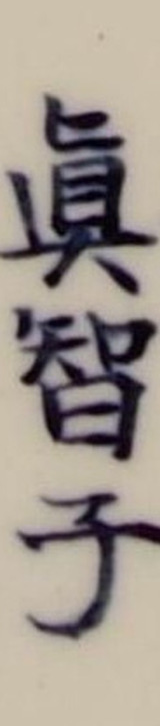真智子
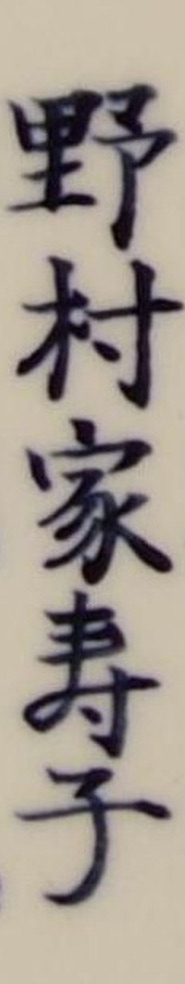野村家寿子
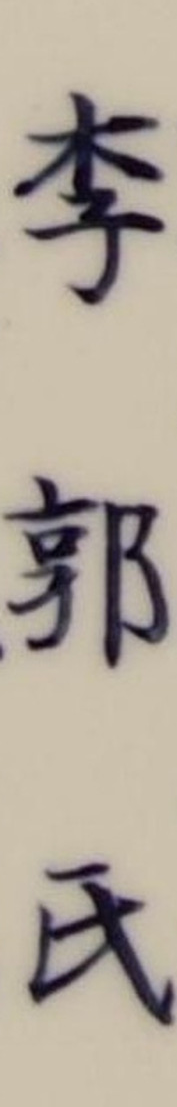李郭氏
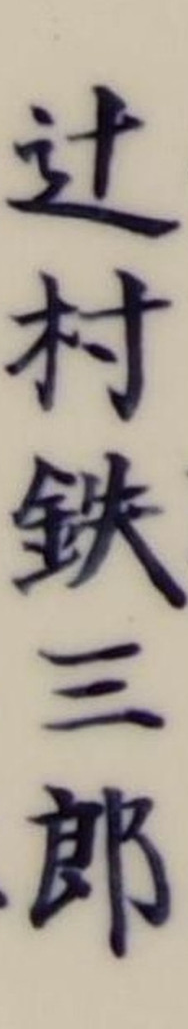辻村鉄三郎
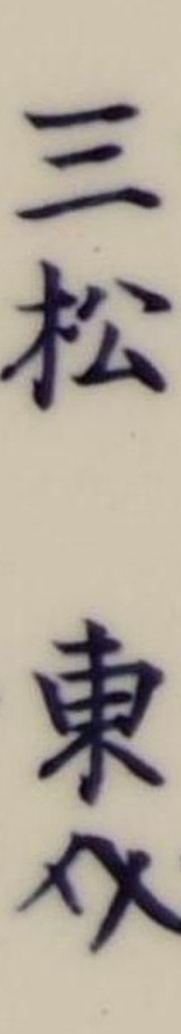三松東介
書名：M~S
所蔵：高野山金剛峯寺
